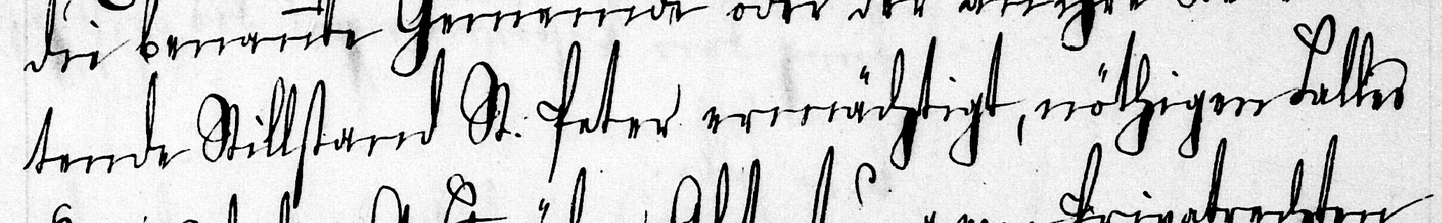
tende Stillstand St. Peter ermächtigt, nöthigen Falles
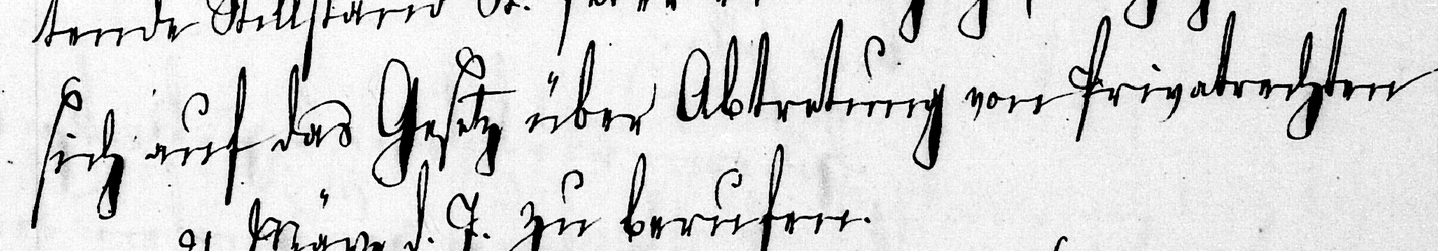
sich auf das Gesetz über Abtretung von Privatrechten
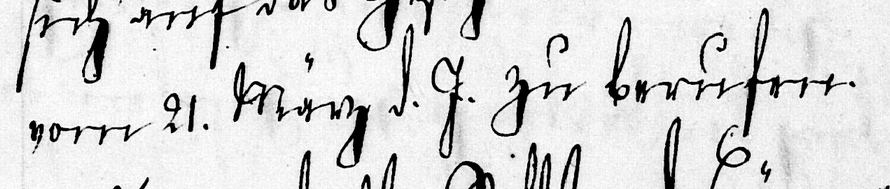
vom 21. März d. J. zu berufen.
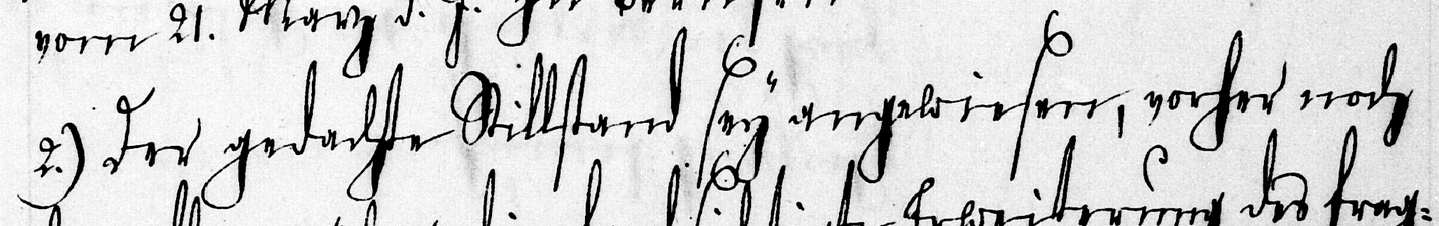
2.) Der gedachte Stillstand sey angewiesen, vorher noch
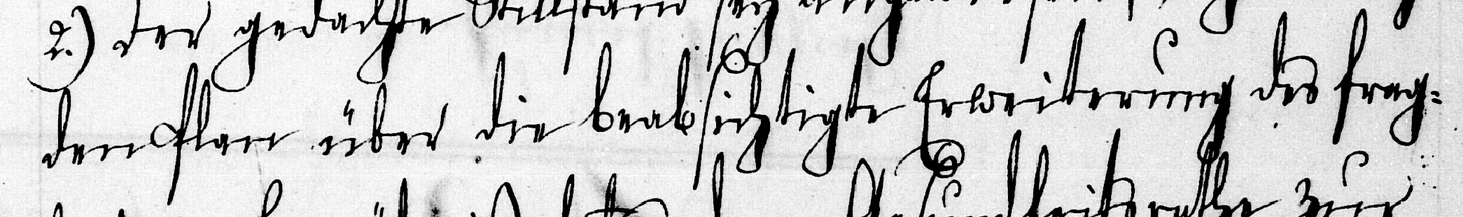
den Plan über die beabsichtigte Erweiterung des frag¬
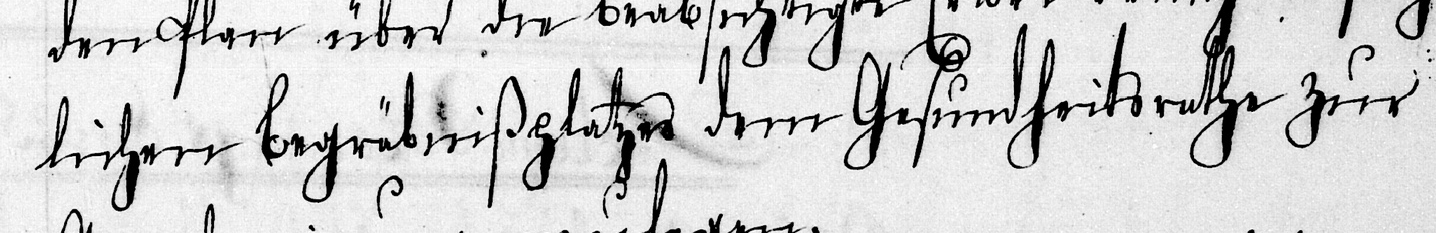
lichen Begräbnißplatzes dem Gesundheitsrathe zur
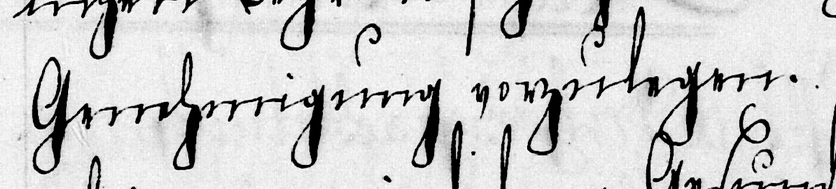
Genehmigung vorzulegen.
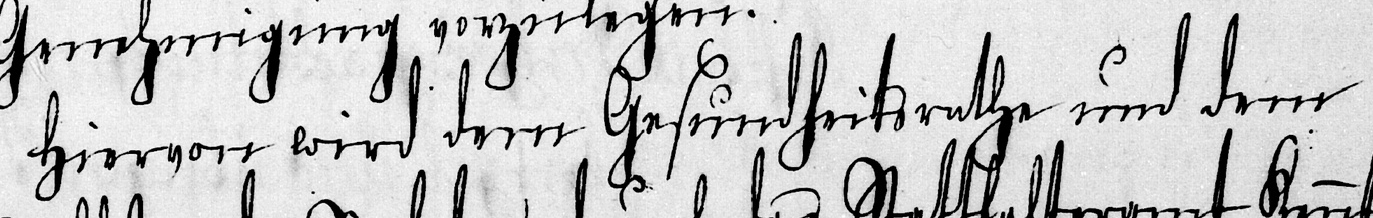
Hiervon wird dem Gesundheitsrathe und dem
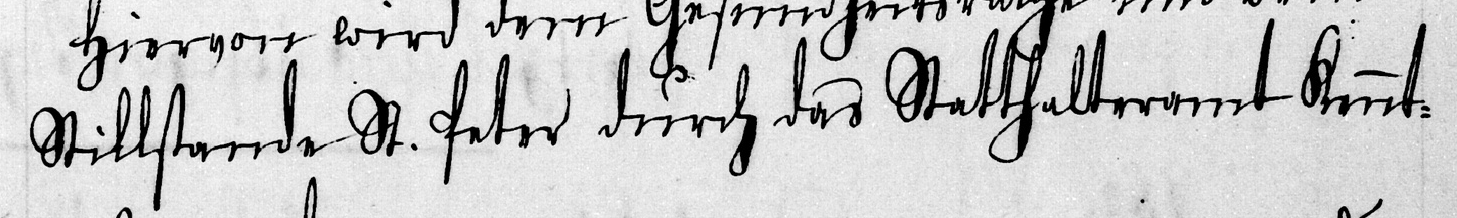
Stillstande St. Peter durch das Statthalteramt Kennt¬
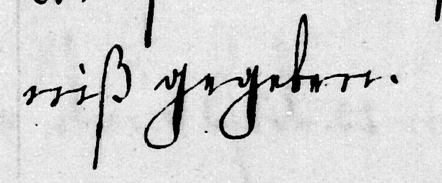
niß gegeben.
